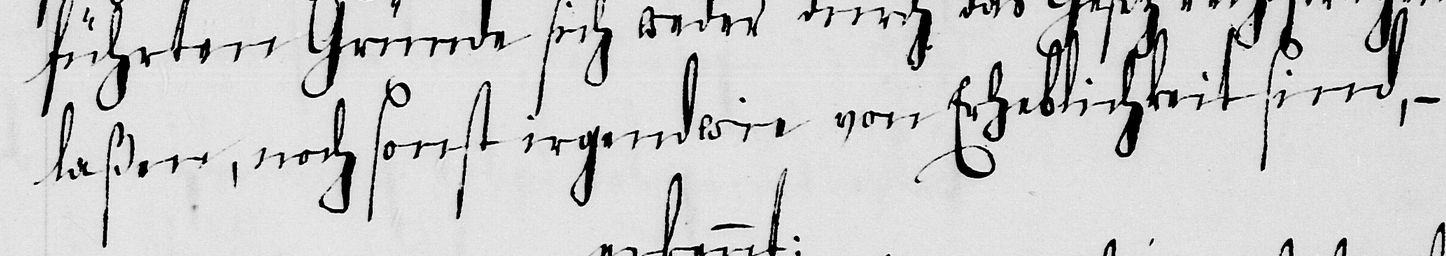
laßen, noch sonst irgendwie von Erheblichkeit sind,
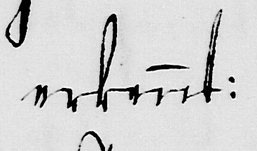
erkennt:
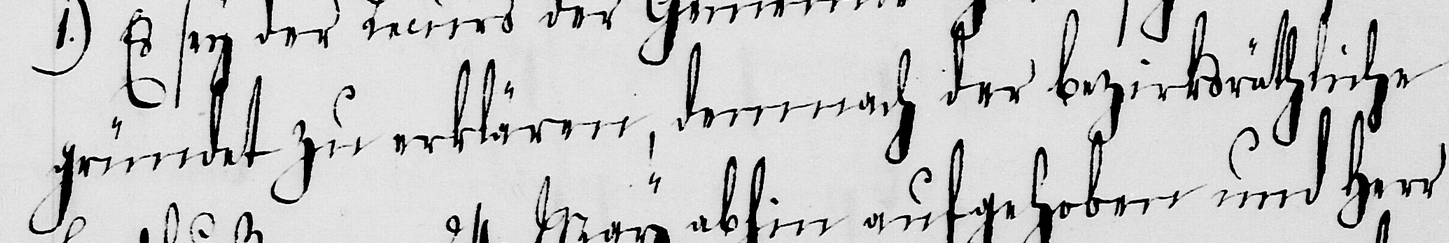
gründet zu erklären, demnach der bezirksräthliche
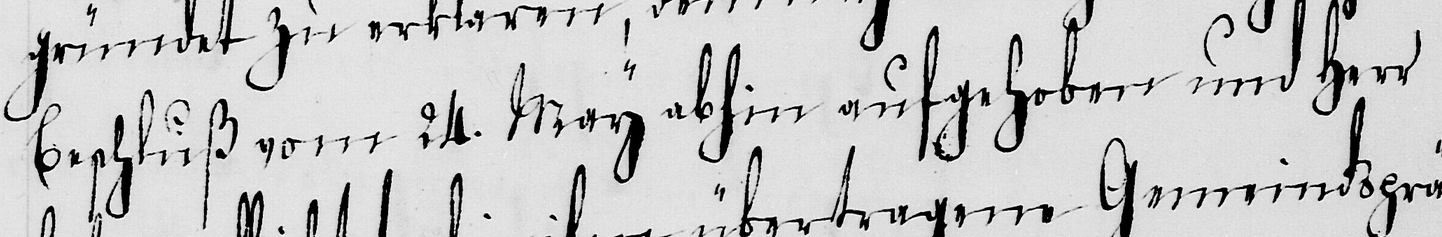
Beschluß vom 24. May abhin aufgehoben und Herr
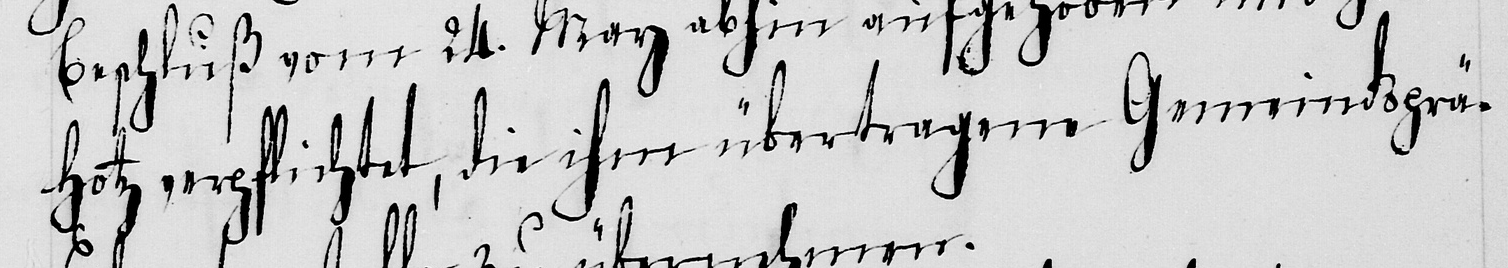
Hotz verpflichtet, die ihm übertragene Gemeindsprä¬
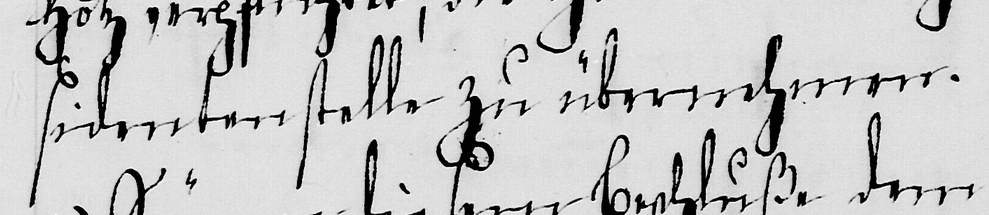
sidentenstelle zu übernehmen.
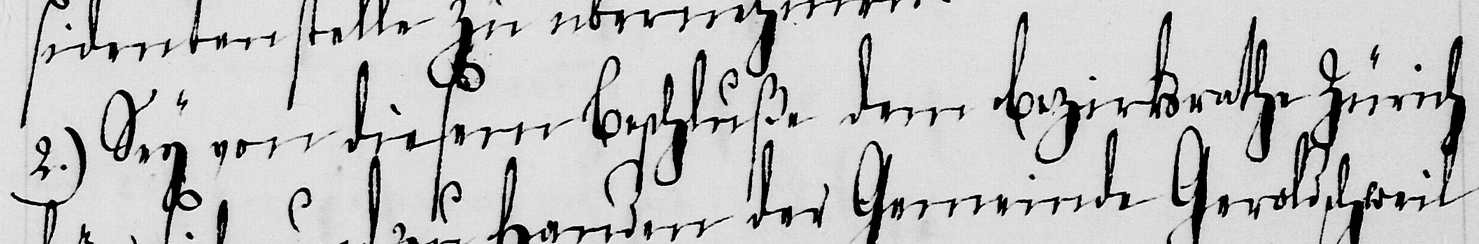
2.) Sey von diesem Beschluße dem Bezirksrathe Zürich
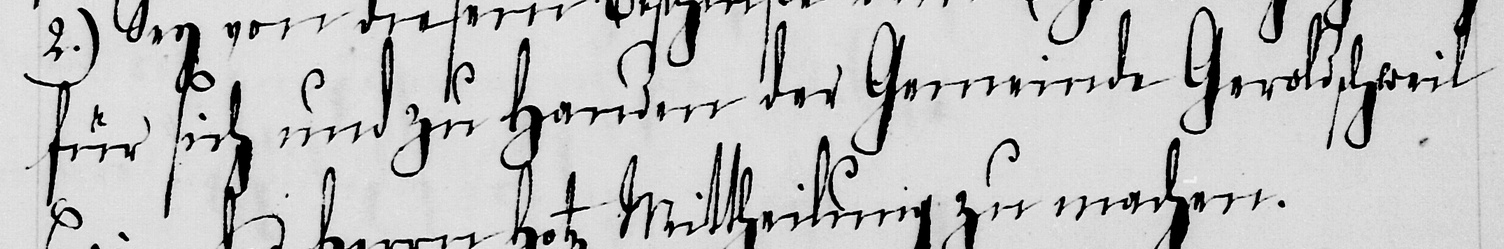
für sich und zu Handen der Gemeinde Geroldschweil
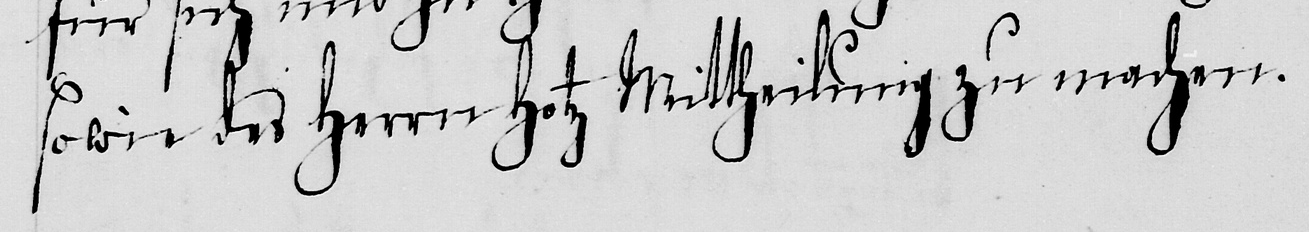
sowie des Herrn Hotz Mittheilung zu machen.
